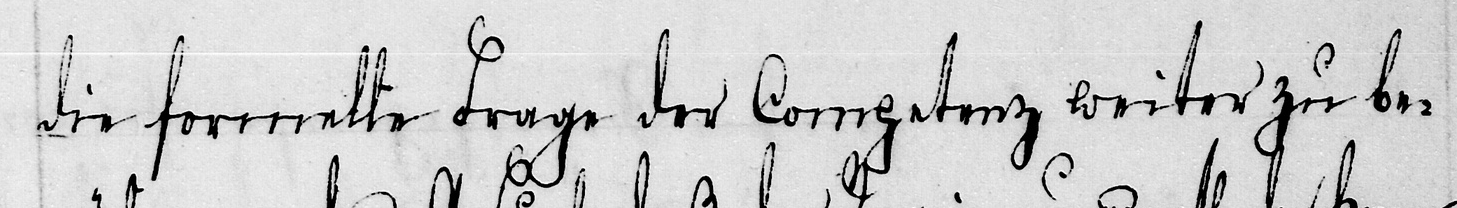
die formelle Frage der Competenz weiter zu be¬
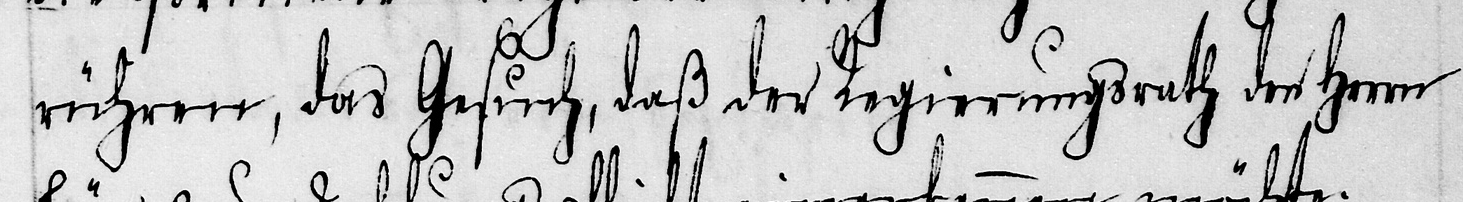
rühren, das Gesuch, daß der Regierungsrath den Herrn
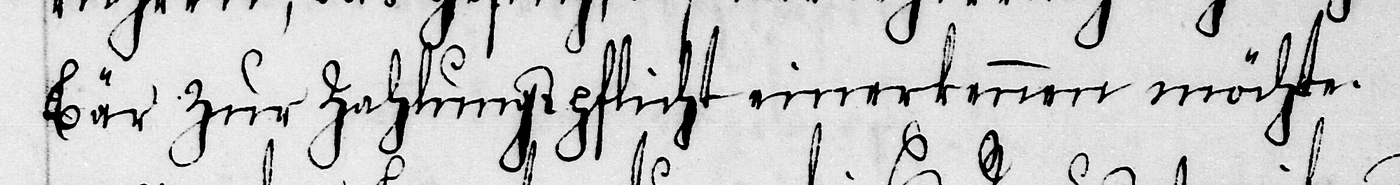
Bär zur Zahlungspflicht einerkennen möchte.
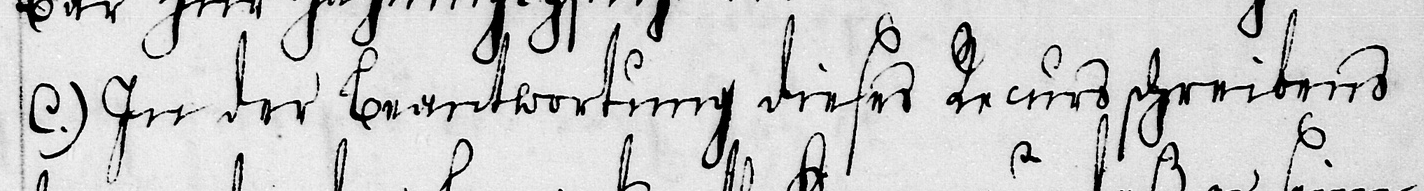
C.) In der Beantwortung dieses Recursschreibens
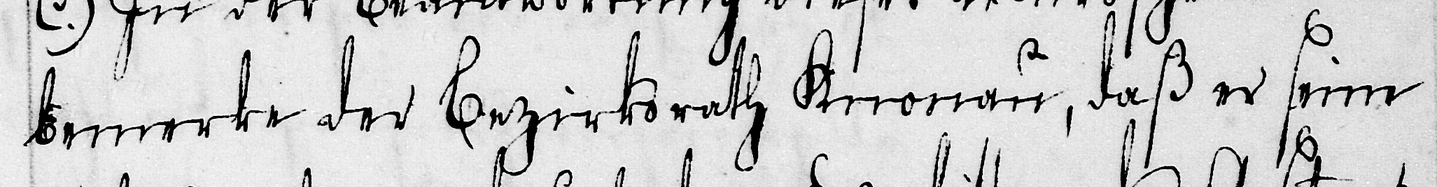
bemerke der Bezirksrath Knonau, daß er seine
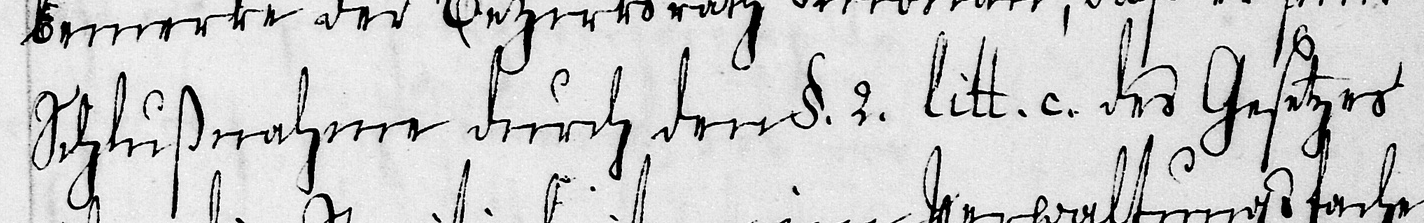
Schlußnahme durch den §. 2. litt. c. des Gesetzes
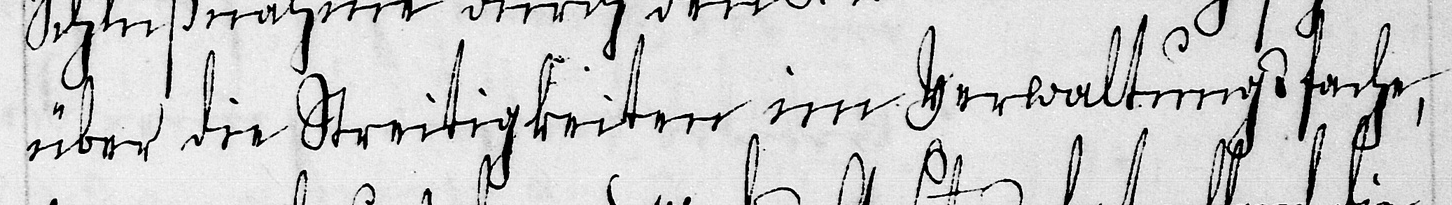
über die Streitigkeiten im Verwaltungsfache,
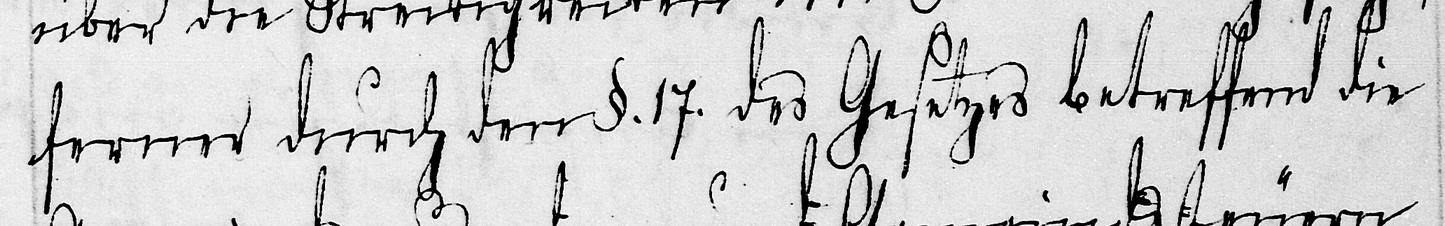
ferner durch den §. 17. des Gesetzes betreffend die
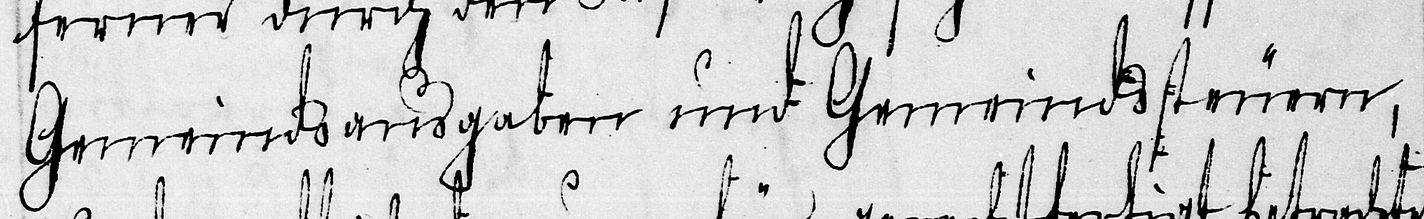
Gemeindsausgaben und Gemeindssteuern,
